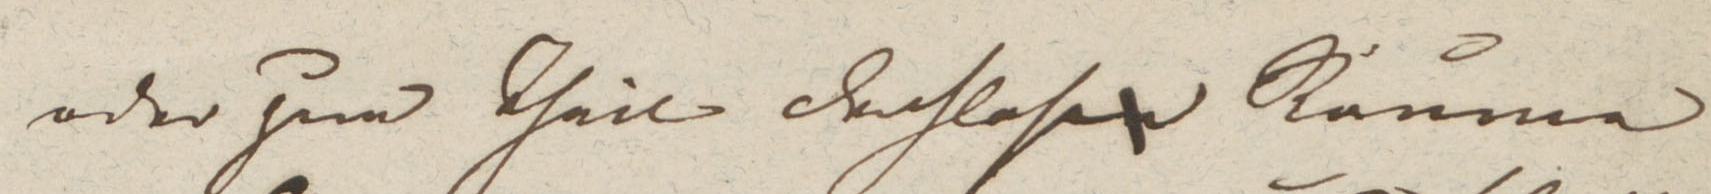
oder zum Theil dachlosen Räume
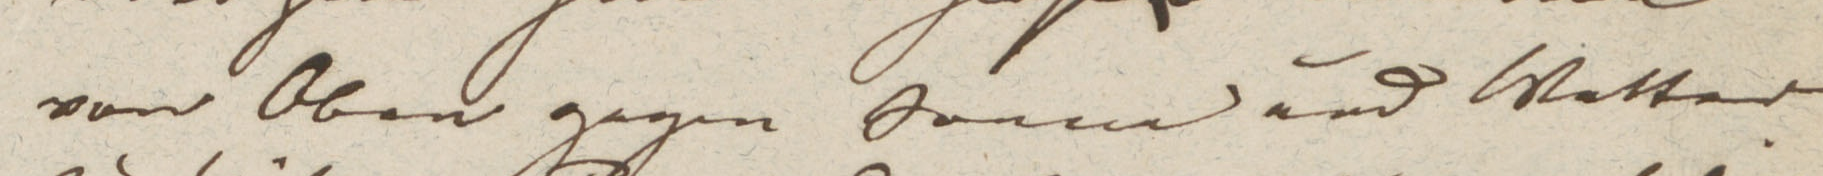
von Oben gegen Sonne und Wetter
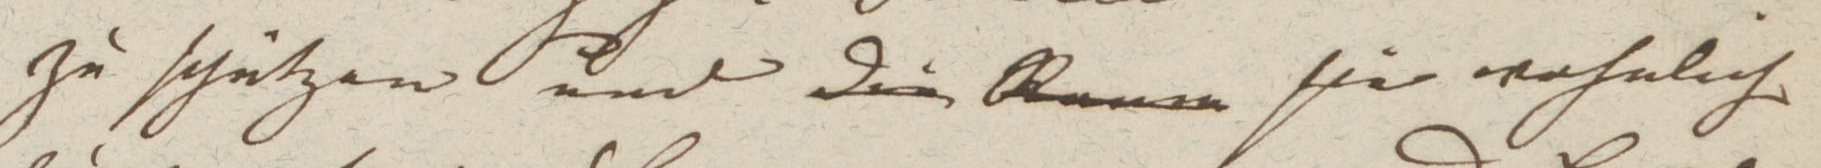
zu schützen und die Raum sie wohnlich
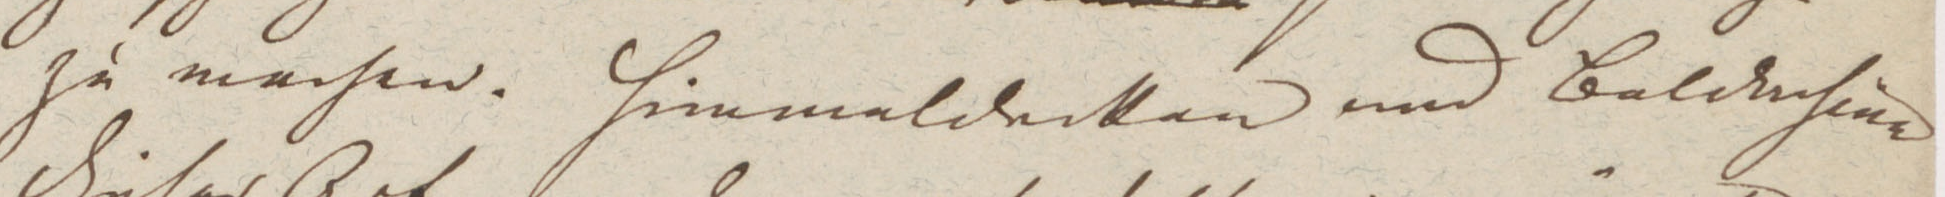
zu machen. Himmeldecken und Baldachine
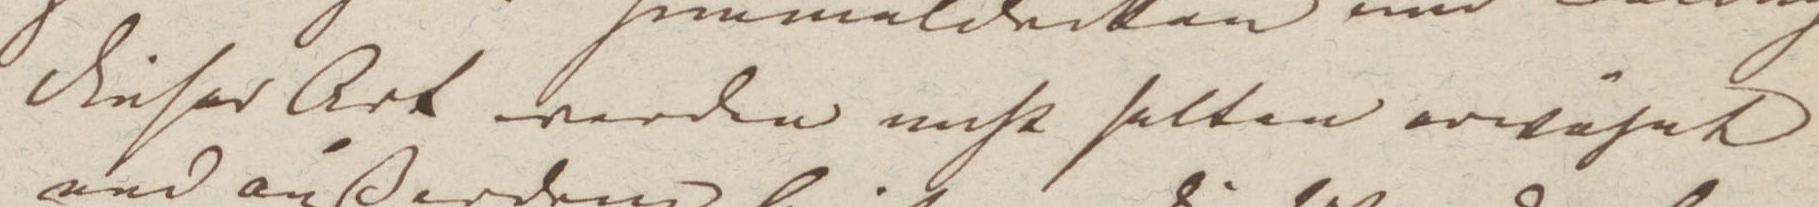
dieser Art werden nicht selten erwähnt
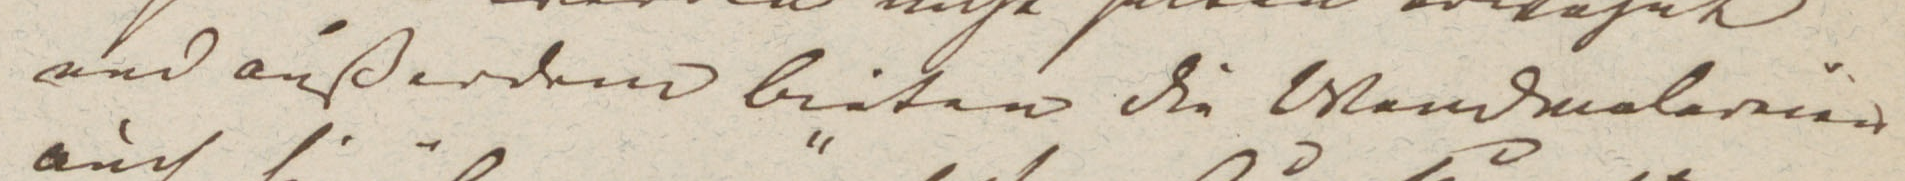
und ausserdem bieten die Wandmalereien
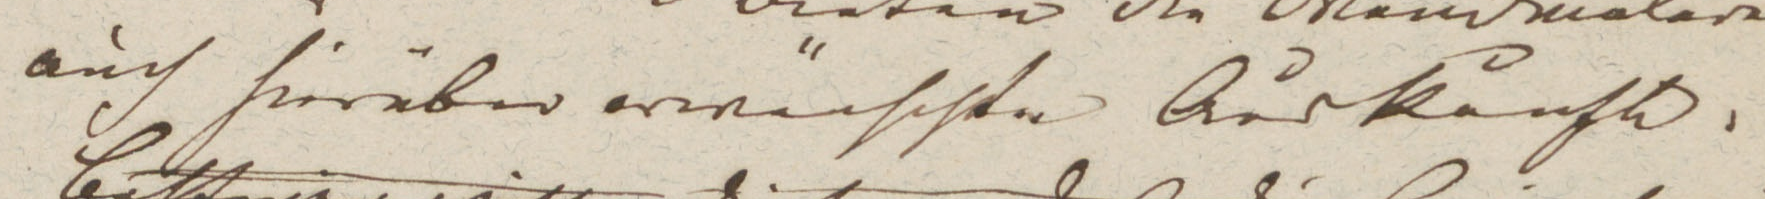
auch hierüber erwünschte Auskunft.
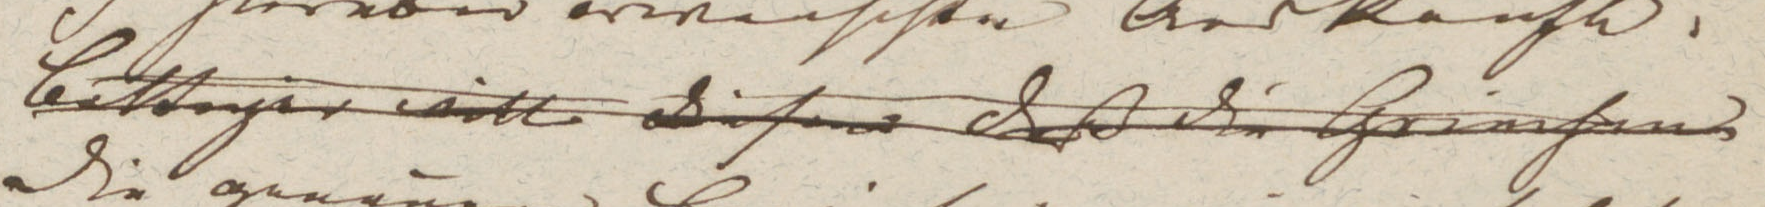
Böttiger will diesen dass die Griechen
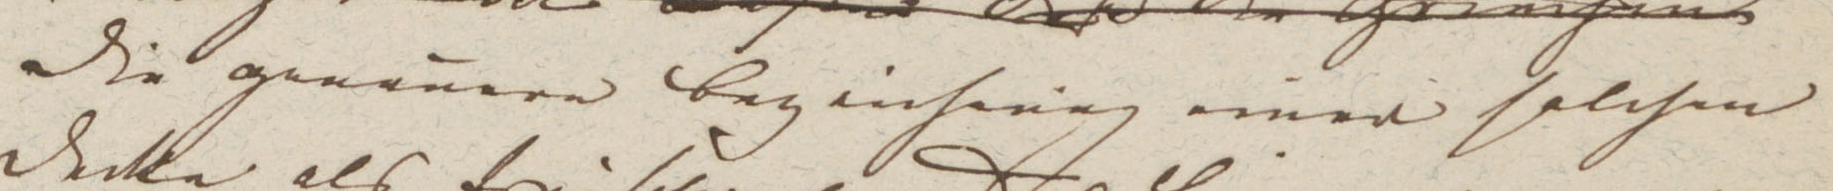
Die genauere Bezeichnung einer solchen
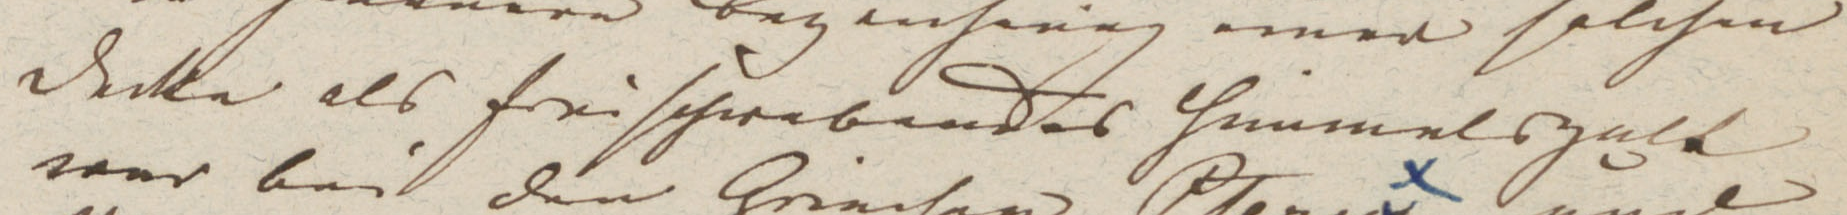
Decke als freischwebendes Himmelszelt
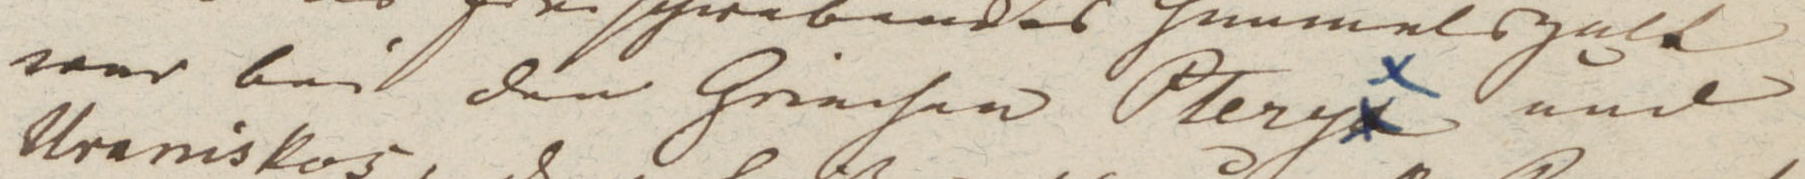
war bei den Griechen Pteryx und
